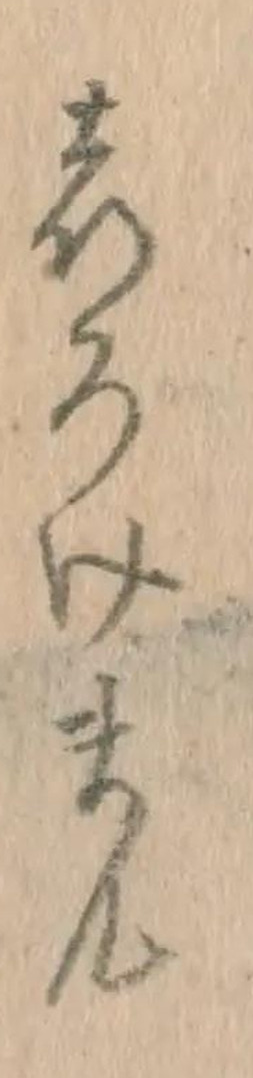しろけまん
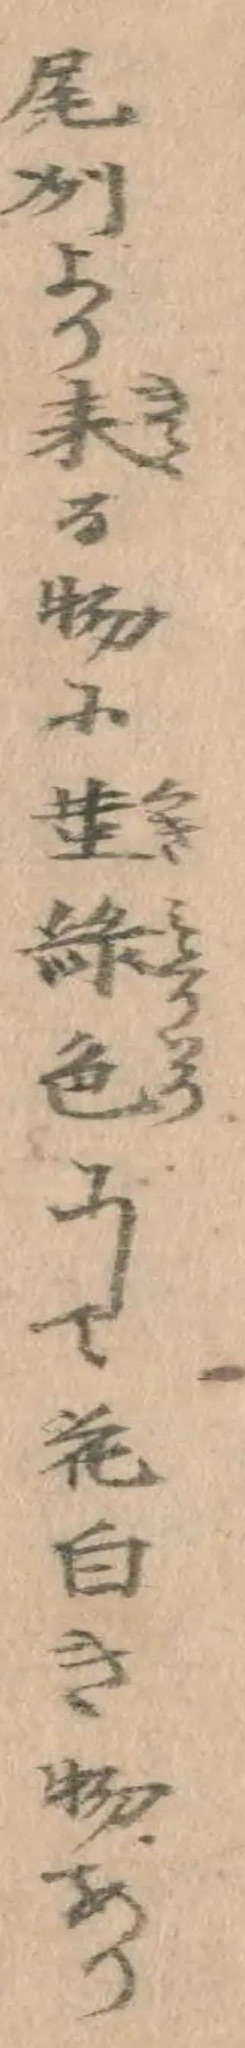尾州より来る物に茎緑色にして花白き物あり
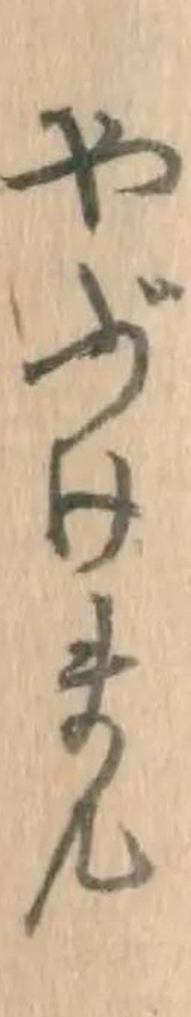やぶけまん
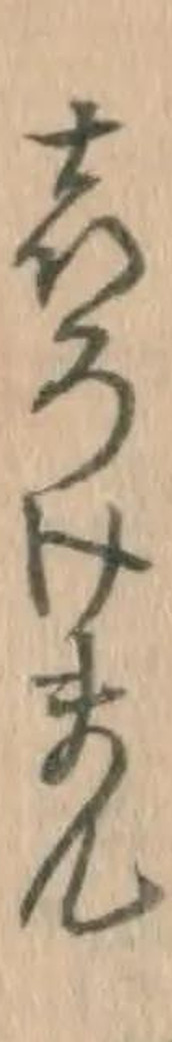しろけまん

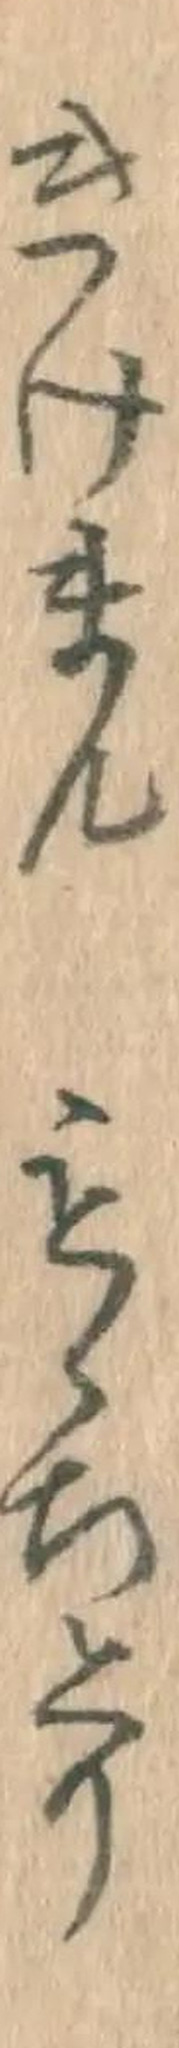きけまんもゝちとり
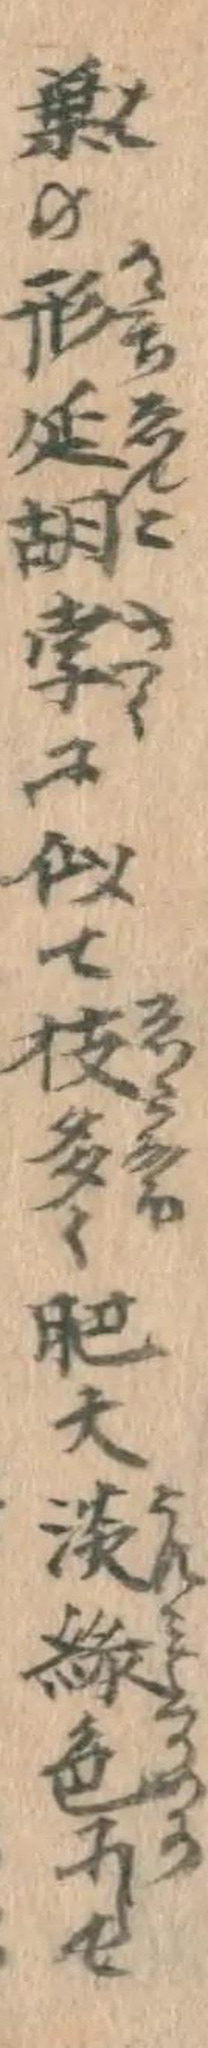葉の形延胡孛に似て枝多く肥大淡緑色にして
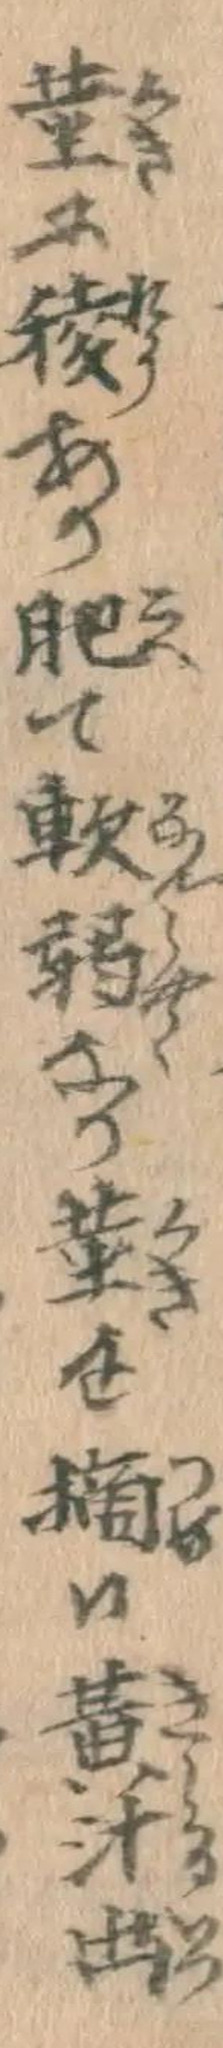茎に稜あり肥て軟弱なり茎を摘は黄汁出
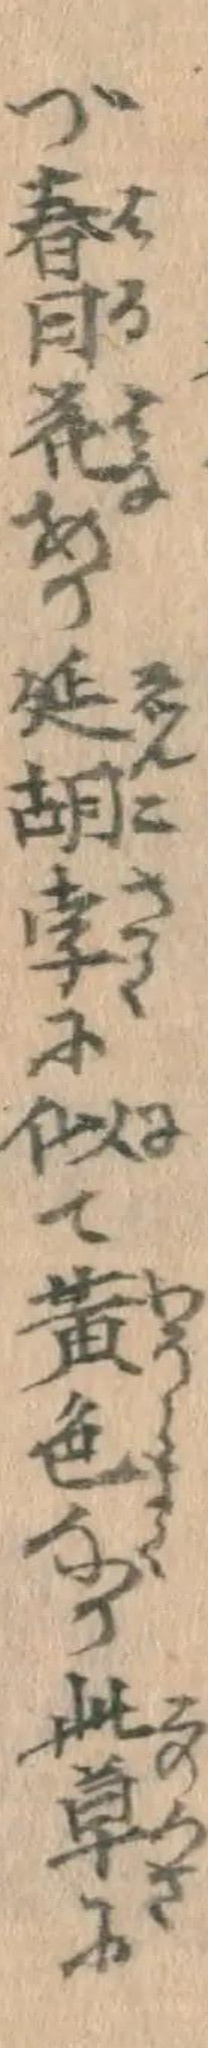づ春月花あり延胡孛に似て黄色なり此草に
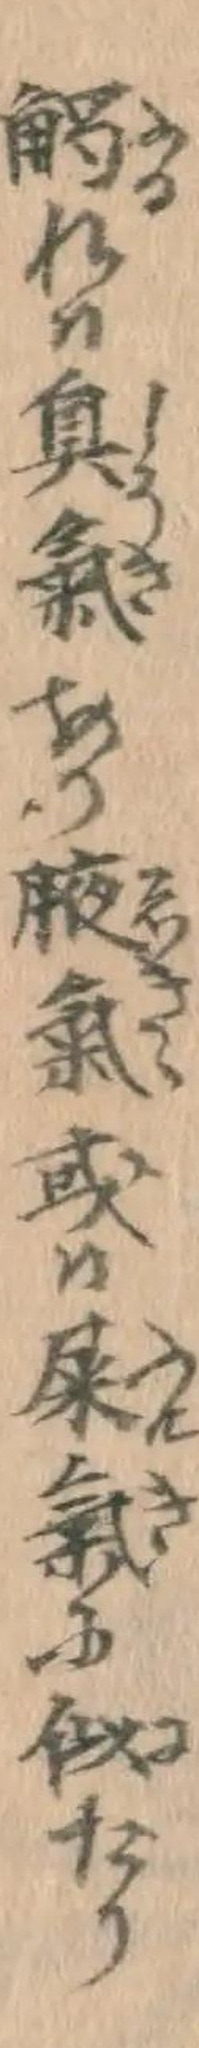触れは臭気あり腋気或は屎気に似たり
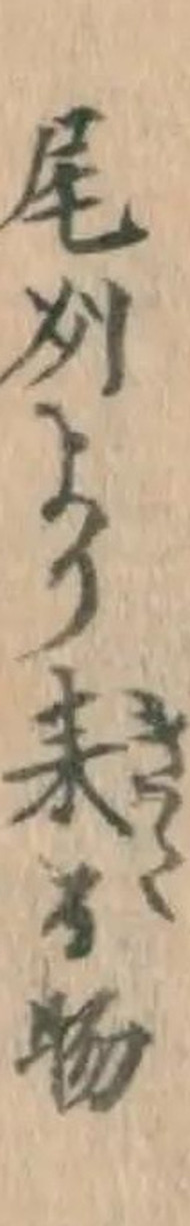尾州より来る物
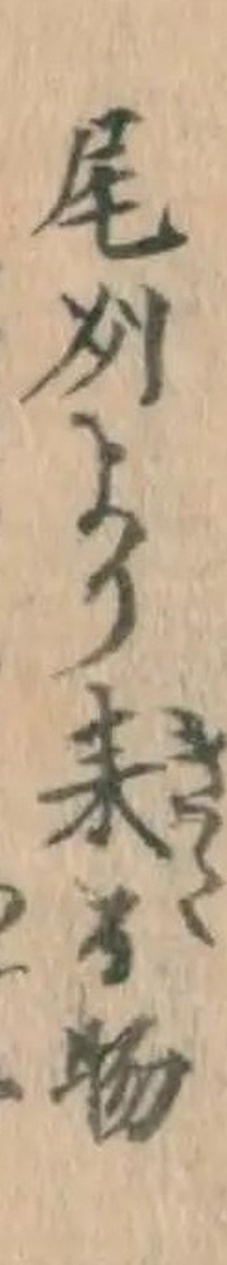尾州より来る物
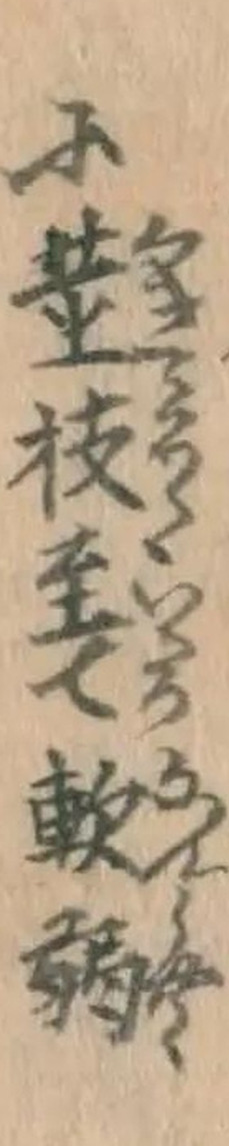に茎枝至て軟弱
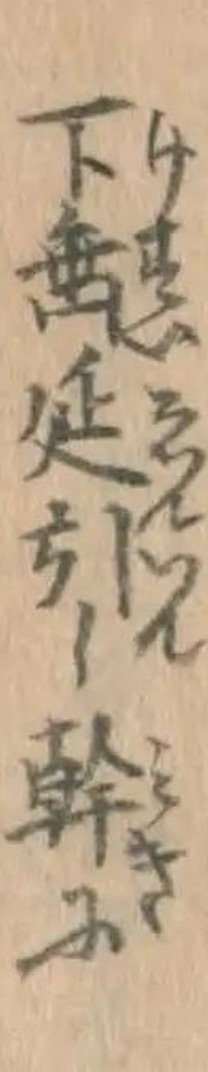下垂延引し幹に
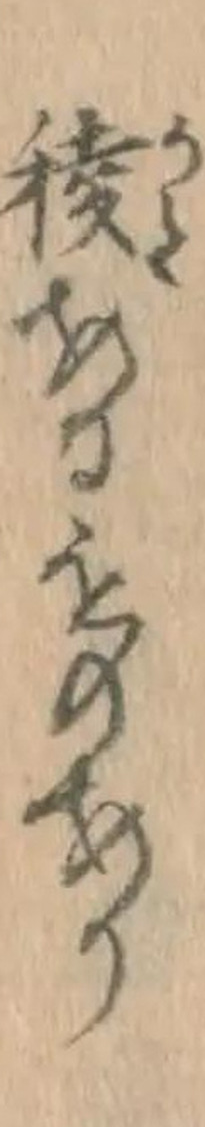稜あるものあり

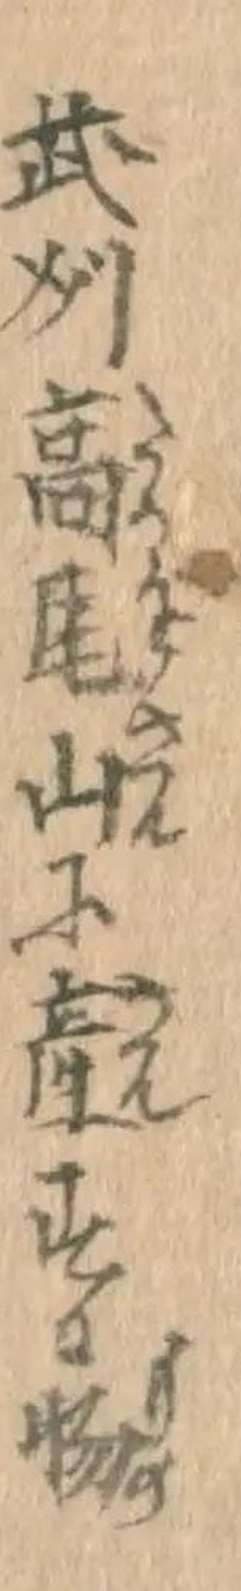武州高尾山に産する物
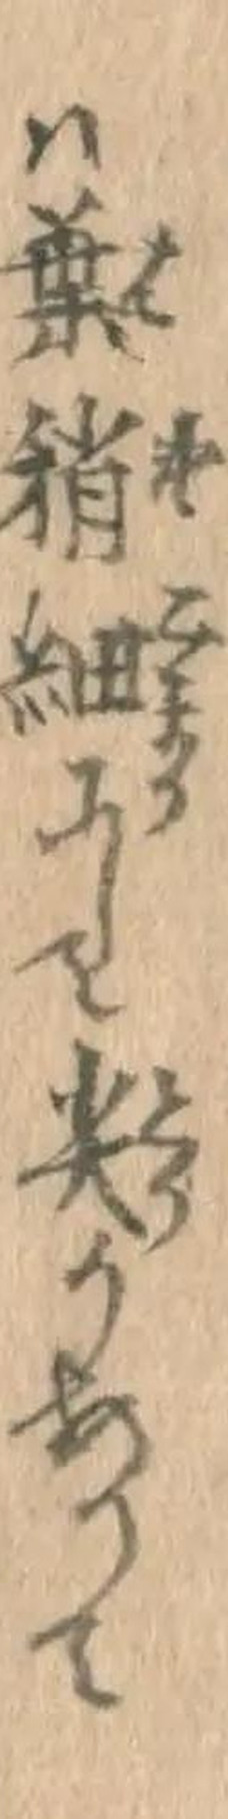は葉稍細にして尖りありて
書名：本草図譜. 巻46-48
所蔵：国立国会図書館 National Diet Library, JAPAN
